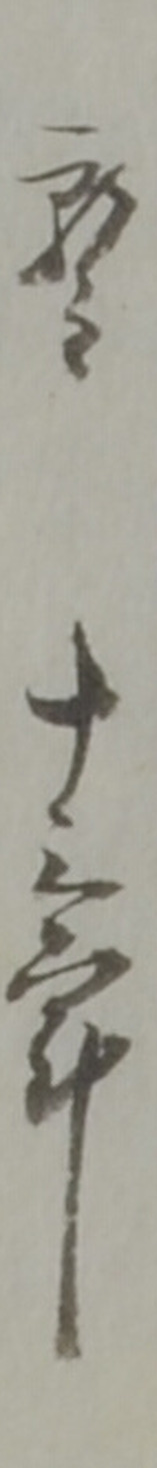願主十三郎
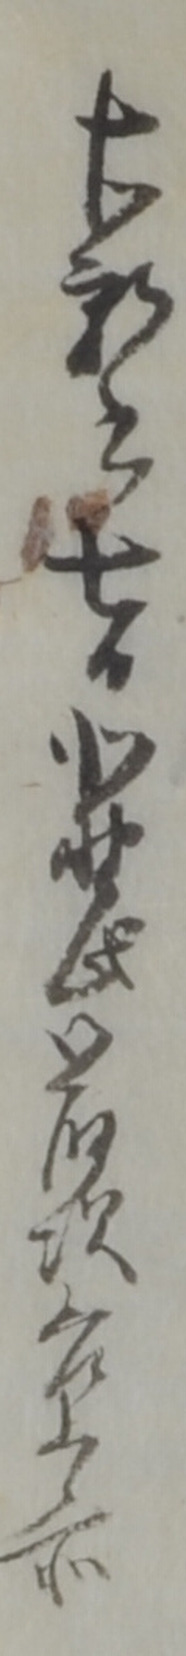右願書七日北野氏御取次差上候所

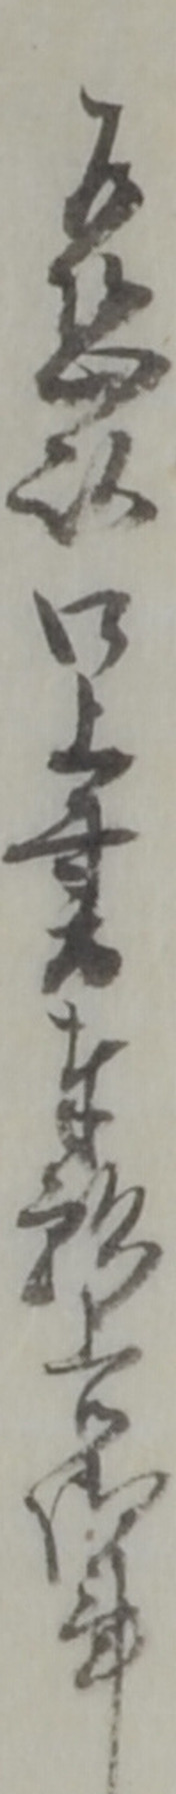乍恐以口上書奉願上候御事
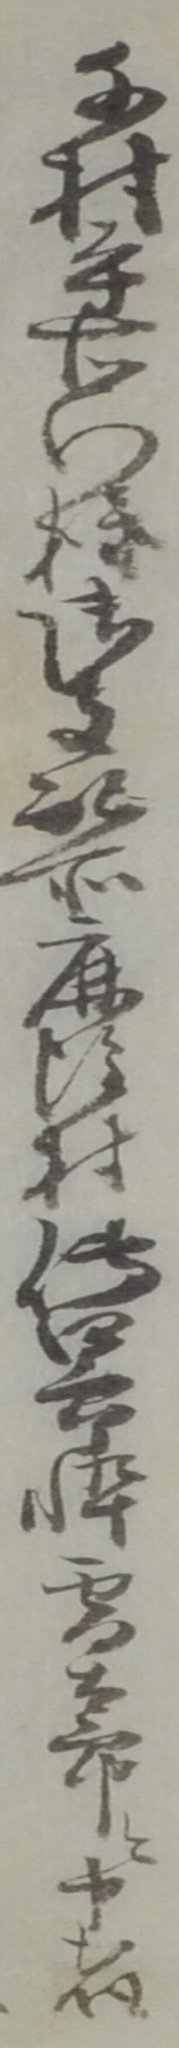千村平右衛門様御支配所廉鹿塩村伝四郎忰雪太郎と申者
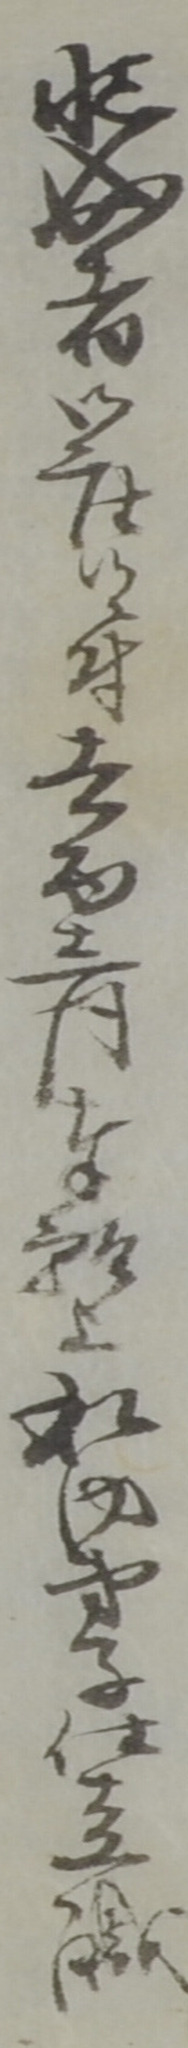慥成者御座候ニ付去酉十二月奉願上私内弟子仕大工職
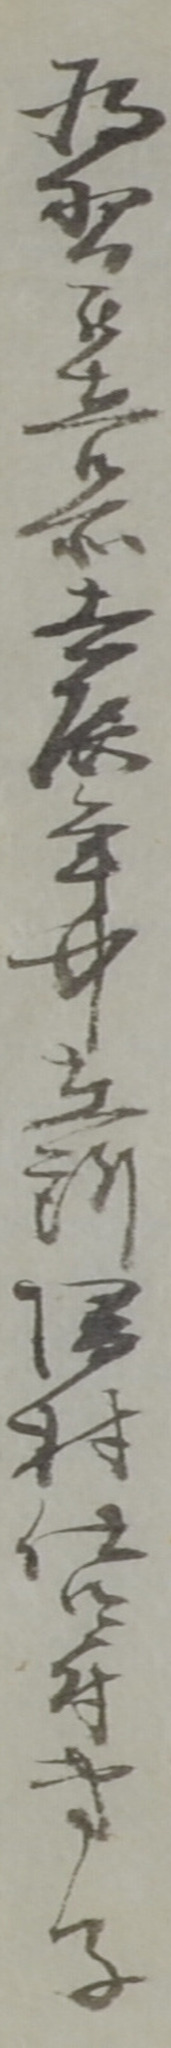為習罷在候所去辰年中在所帰村仕候ニ付弟子
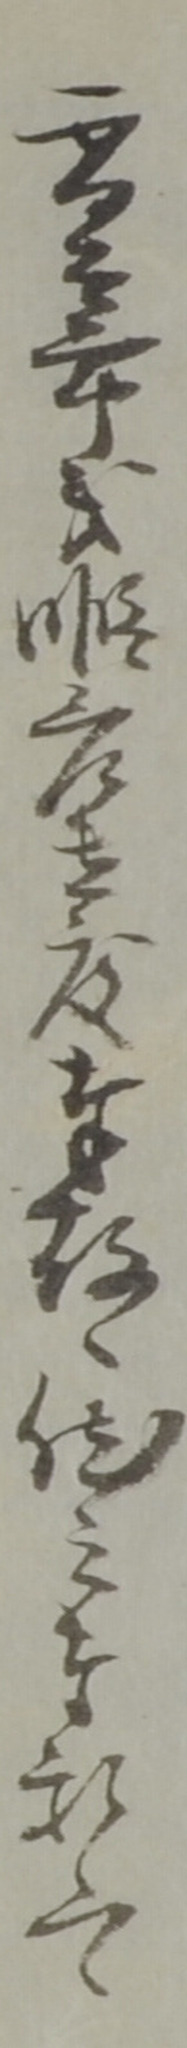雪太郎義暇差遣候度奉存候依之奉願上候
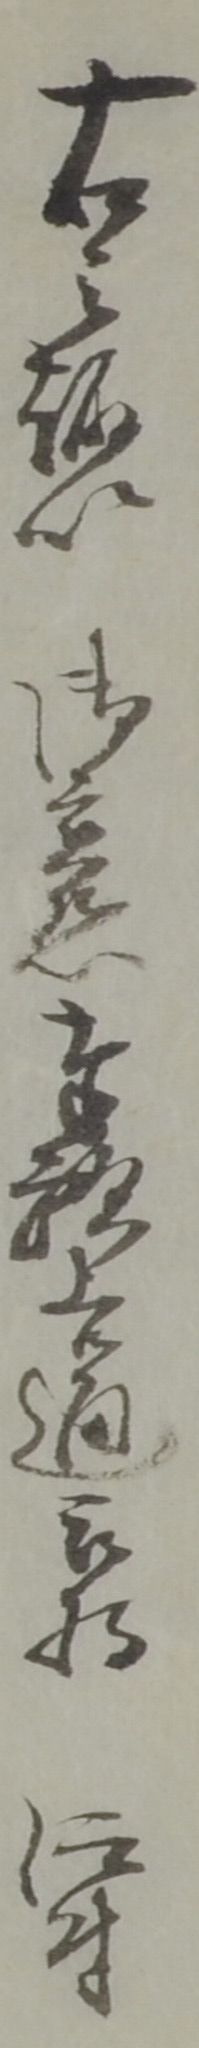右之趣以御慈悲奉願上候通被為仰付
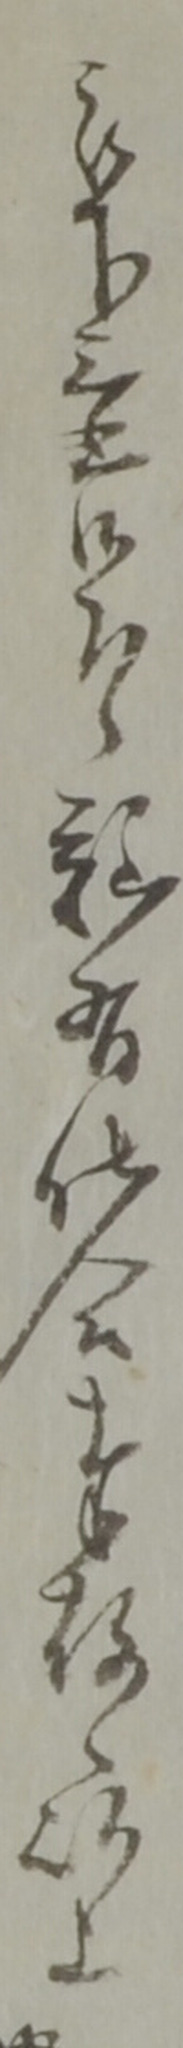被下置候ハヽ難有仕合奉存候以上
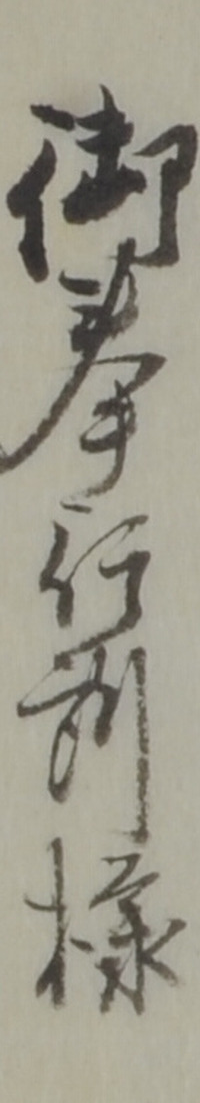御奉行所様
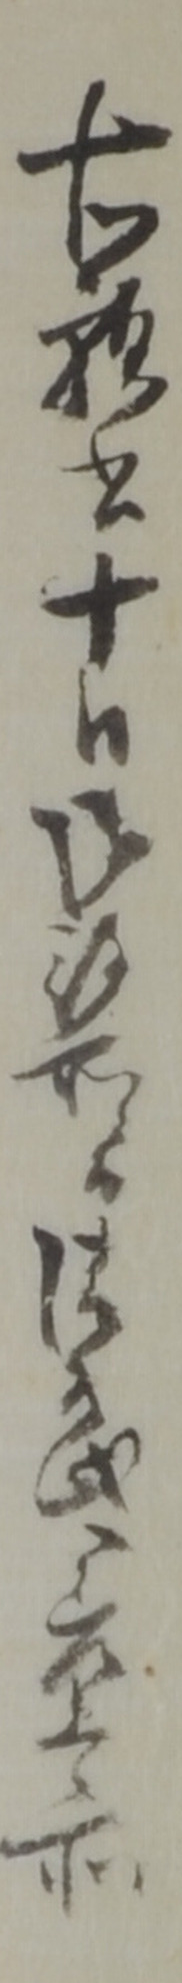右願書十日御役所ニ而清水氏差上候所
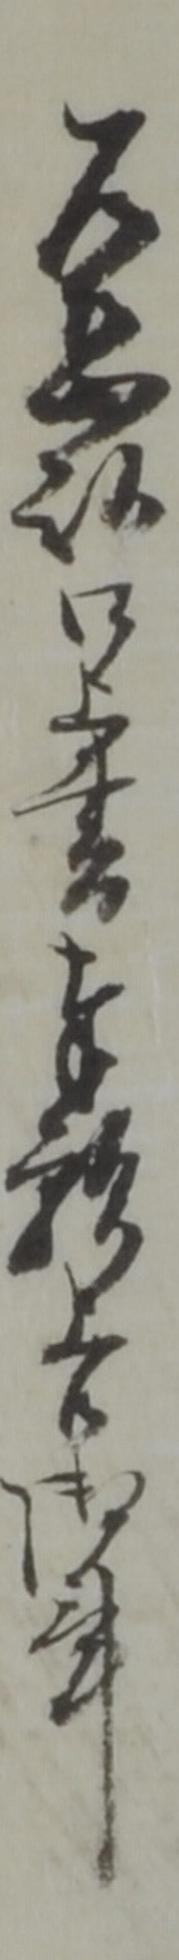乍恐以口上書奉願上候御事
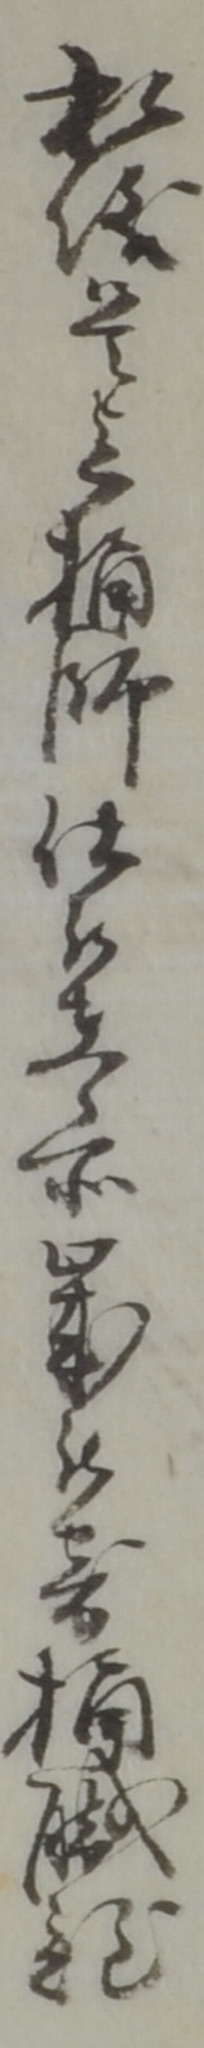私儀是迄桶師仕罷在候所歳罷寄桶職難
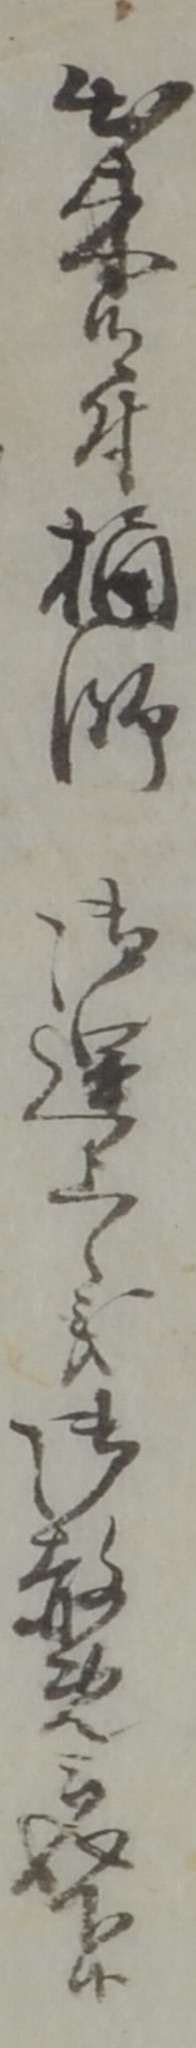出来候ニ付桶師御運上之義御赦免被成下候
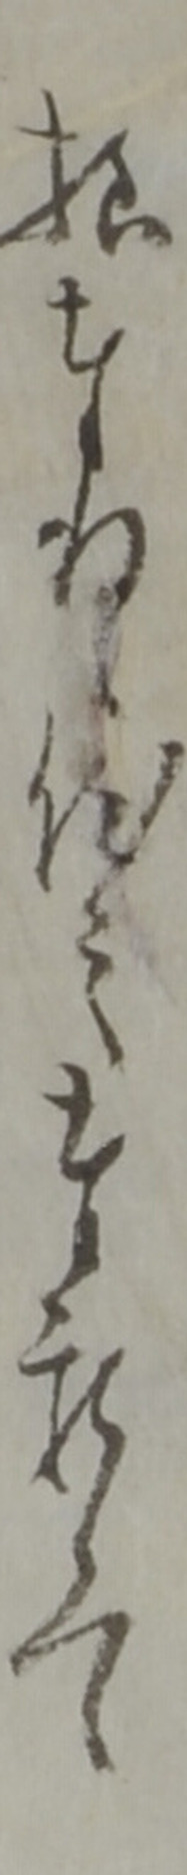様奉存候依之奉願上候
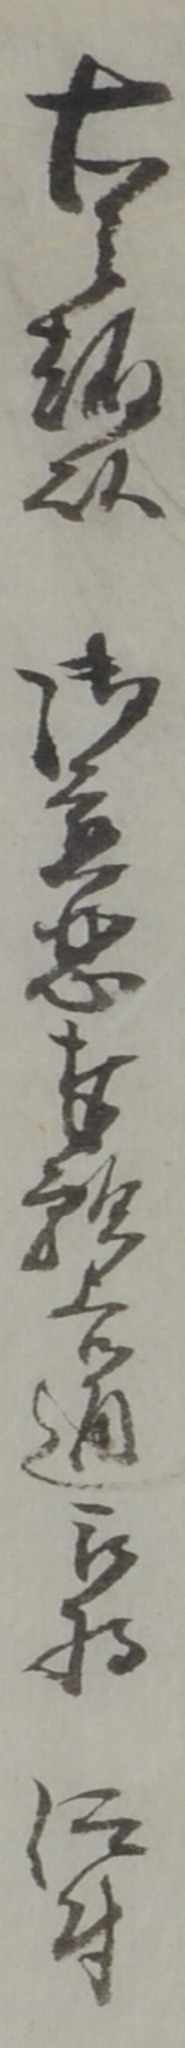右之趣以御慈悲奉願上候通被為仰付
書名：諸願書控簿
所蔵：伊那市立高遠町図書館・合同会社AMANE
